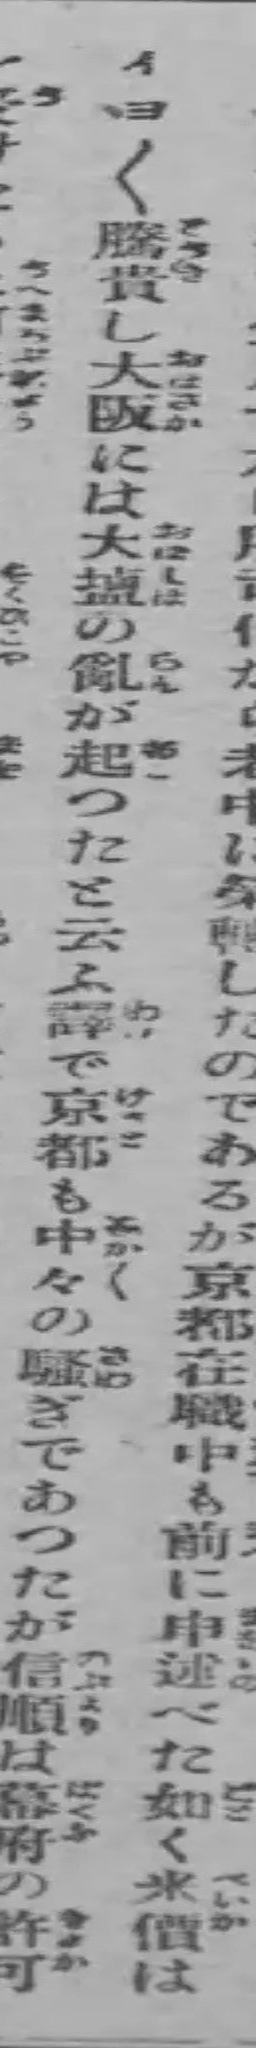イヨ〳〵騰貴し大阪には大塩の乱が起つたと云ふ訳で京都も中々の騒ぎであつたが信順は幕府の許可
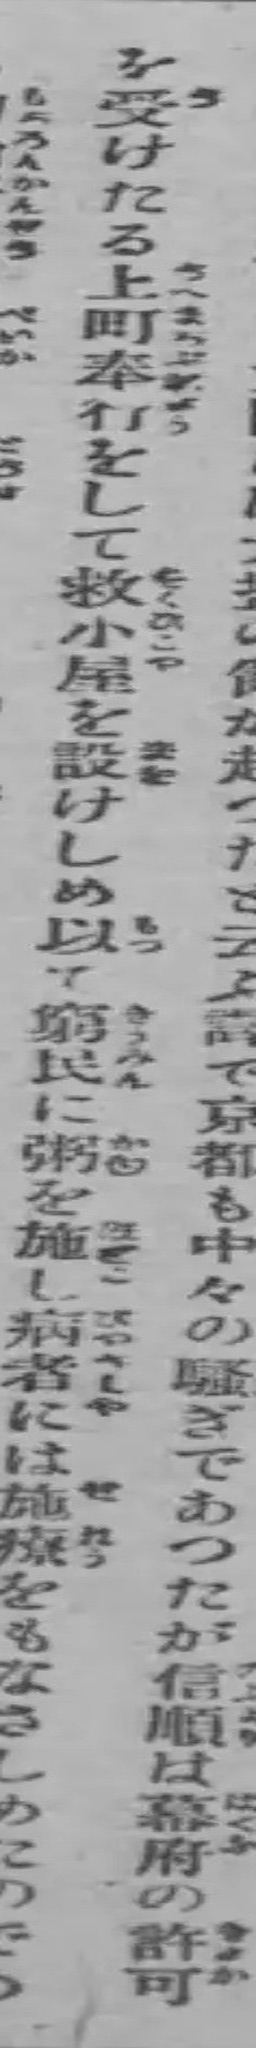を受けたる上町奉行をして救小屋を設けしめ以て窮民に粥を施し病者には施療をもなさしめたのであ
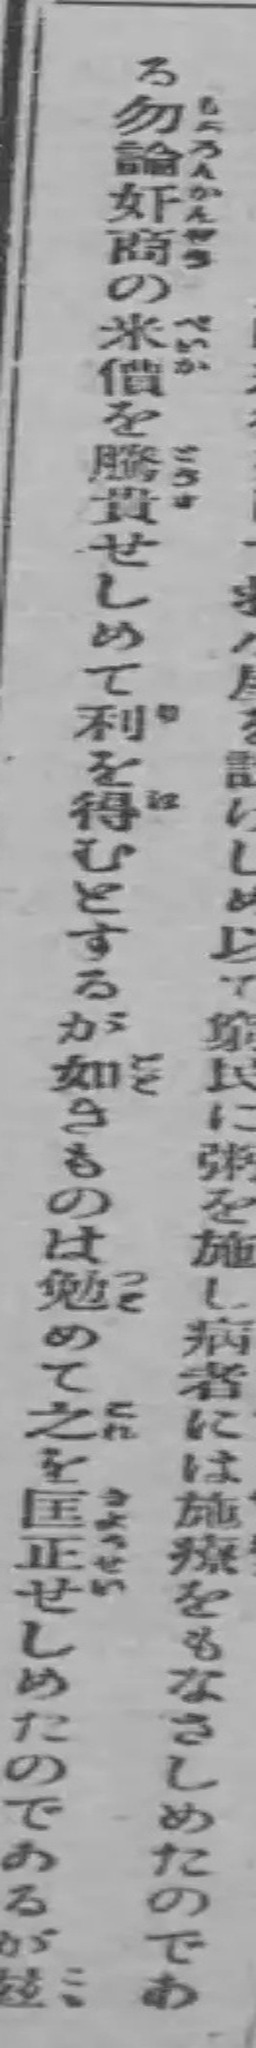る勿論奸商の米価を騰貴せしめて利を得むとするが如きものは勉めて之を匡正せしめたのであるが茲
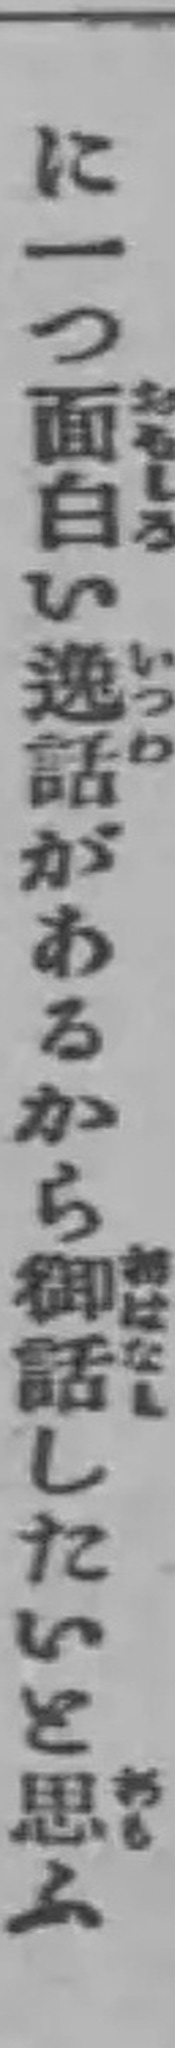に一つ面白い逸話があるから御話したいと思ふ
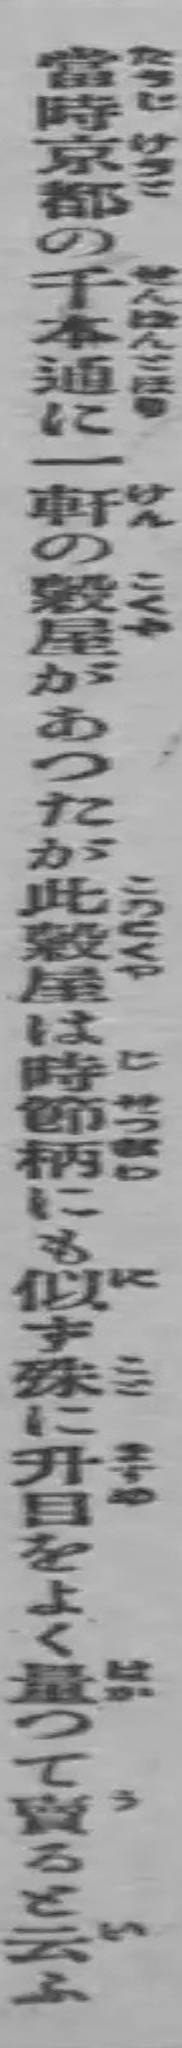当時京都の千本通に一軒の穀屋があつたが此穀屋は時節柄にも似ず殊に升目をよく量つて売ると云ふ
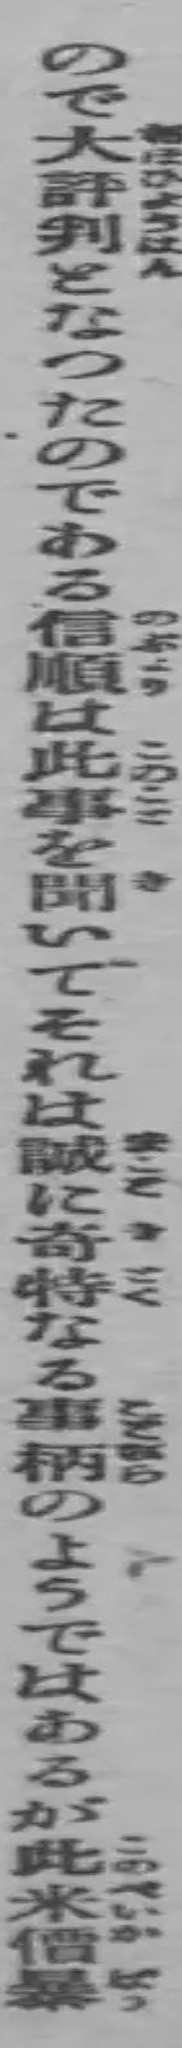ので大評判となつたのである信明は此事を聞いてそれは誠に奇特なる事柄のようではあるが此米価暴
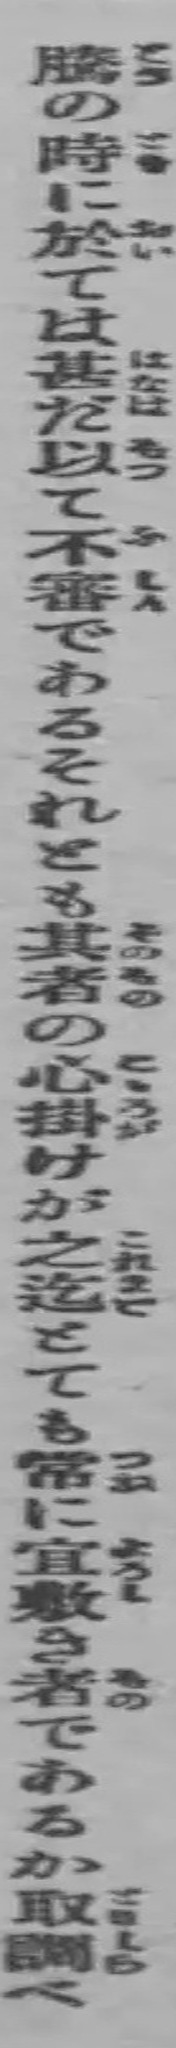騰の時に於ては甚だ以て不審であるそれとも其者の心掛けが之迄とても常に宜敷き者であるか取調べ
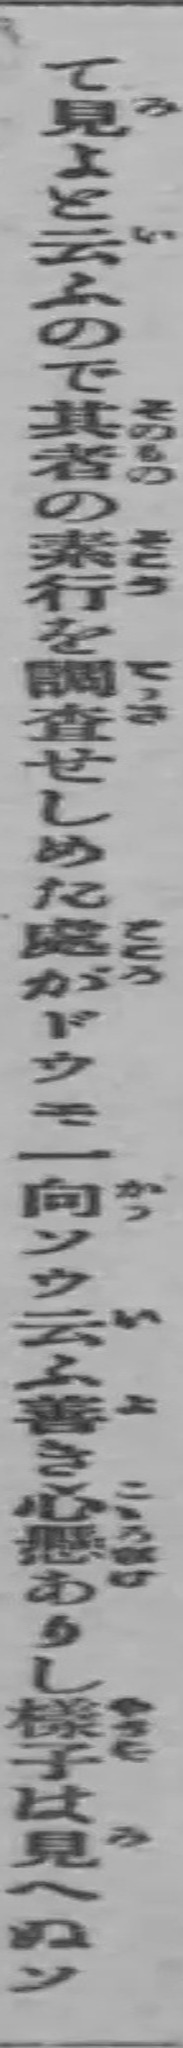て見よと云ふので其者の素行を調査せしめた処がドウモ一向ソウ云ふ善き心懸ありし様子は見へぬソ
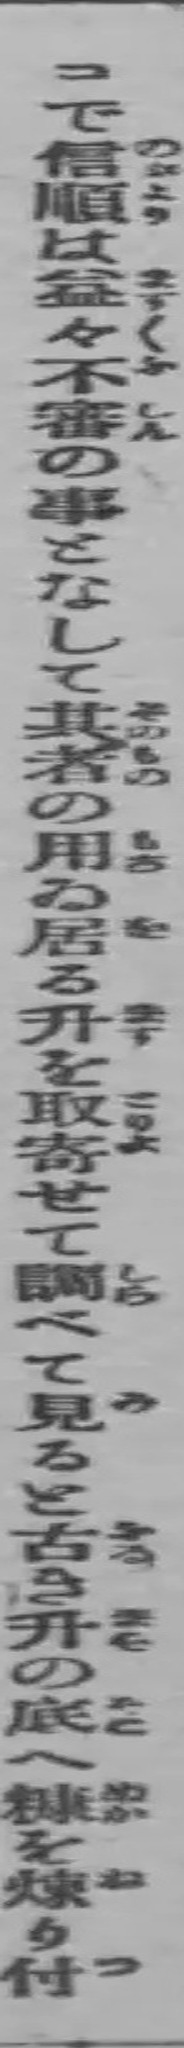コで信順は益々不審の事となして其者の用ゐ居る升を取寄せて調べて見ると古き升の底へ糠を煉り付
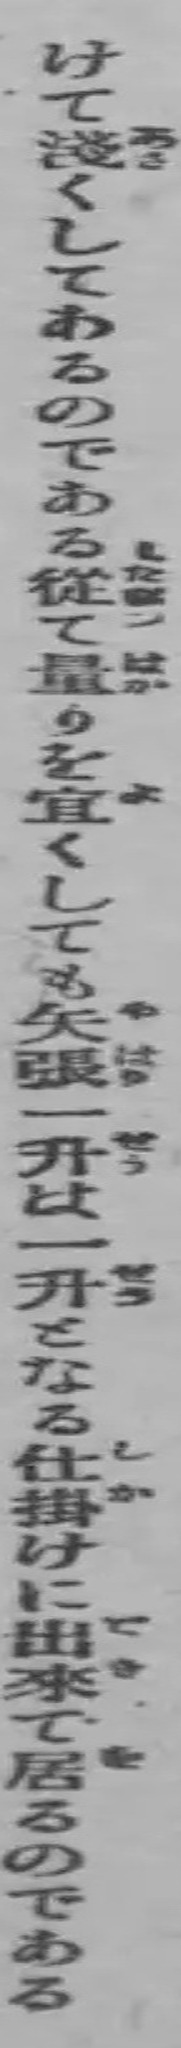けて浅くしてあるのである従て量りを宜くしても矢張一升は一升となる仕掛けに出来て居るのである
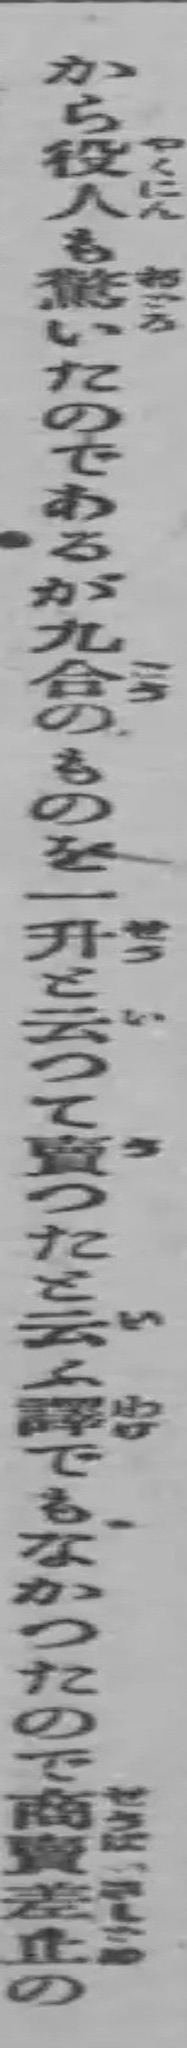から役人も驚いたのであるが九合のものを一升と云つて売つたと云ふ訳でもなかつたので商売差止の
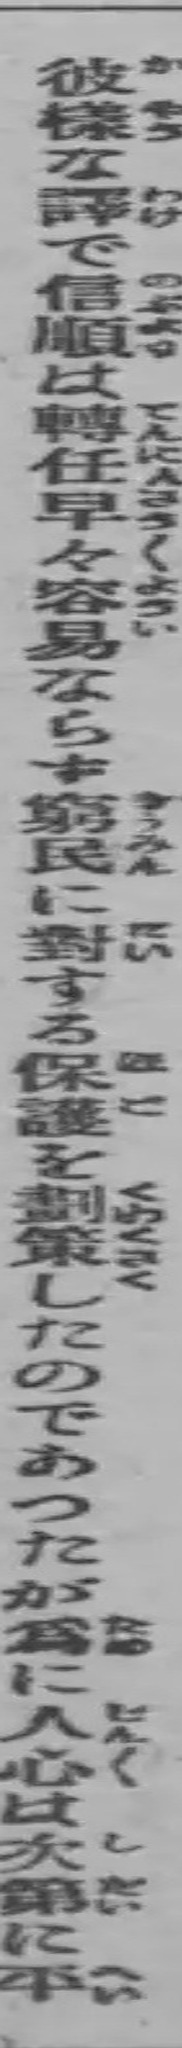彼様な訳で信順は転任早々容易ならず窮民に対する保護を劃策したのであつたが為に人心は次第に平
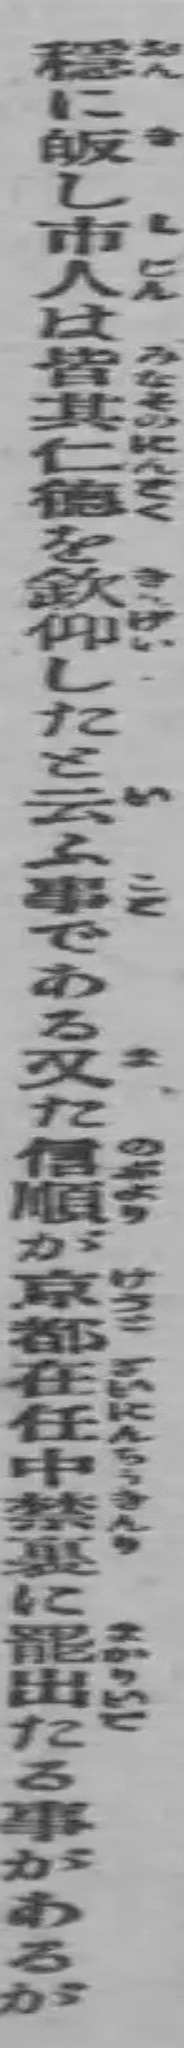穏に皈し市人は皆其仁徳を欽仰したと云ふ事である又た信順が京都在任中禁裏に罷出たる事があるが
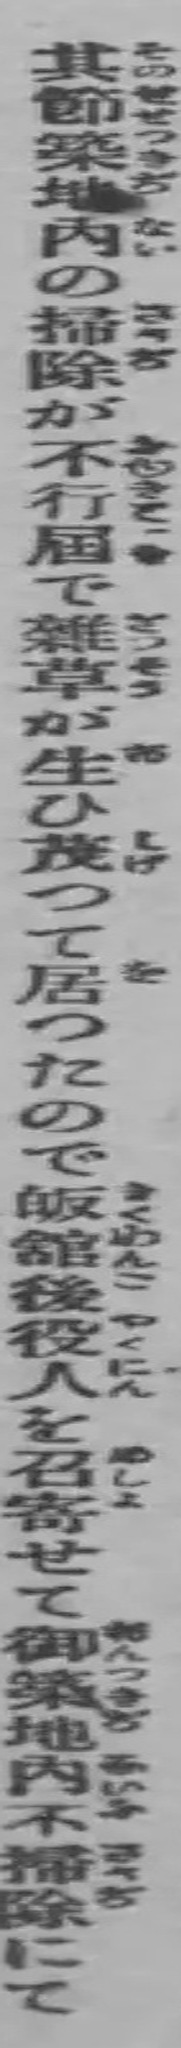其節築地内の掃除が不行届で雑草が生ひ茂つて居つたので皈館後役人を召寄せて御築地内不掃除にて
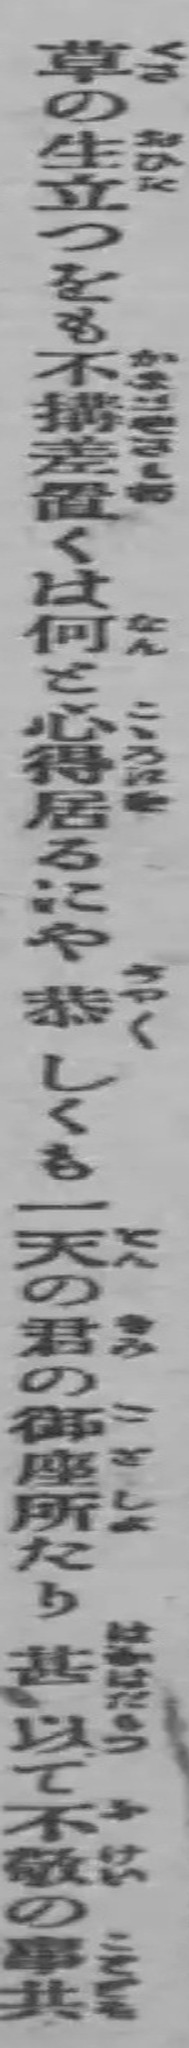草の生立つをも不構差置くは何と心得居るにや恭しくも一天の君の御座所たり甚以て不敬の事共
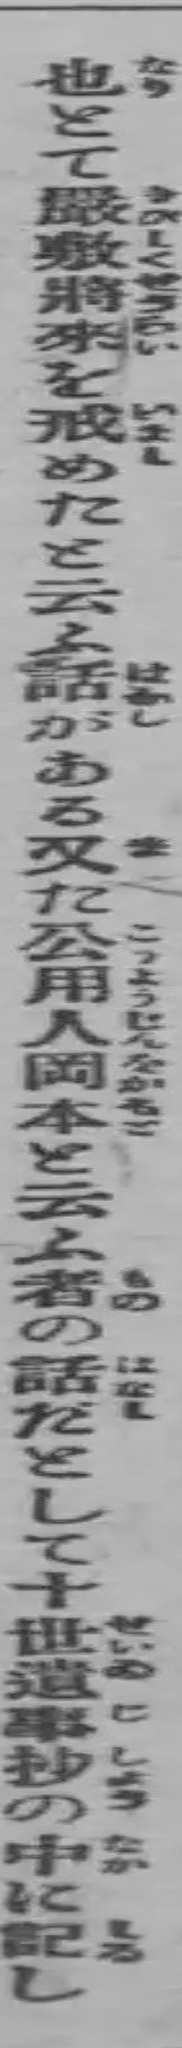也とて厳敷将来を戒めたと云ふ話がある又た公用人岡本と云ふ者の話だとして十世遺事鈔の中に記し
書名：豊橋市史談
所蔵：国立国会図書館 National Diet Library, JAPAN
